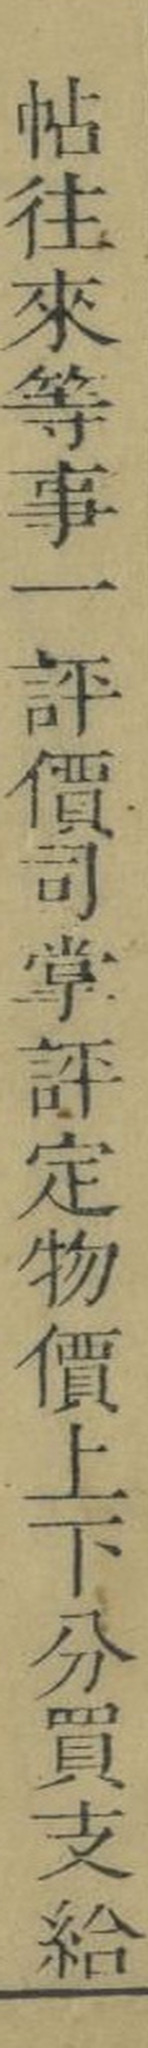帖往來等事一評價司掌評定物價上下分買支給
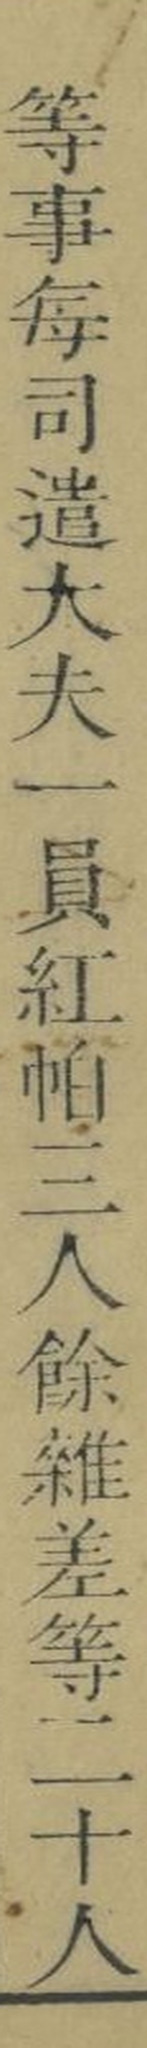等事每司遣大夫一員紅帕三人餘雜差等二十人
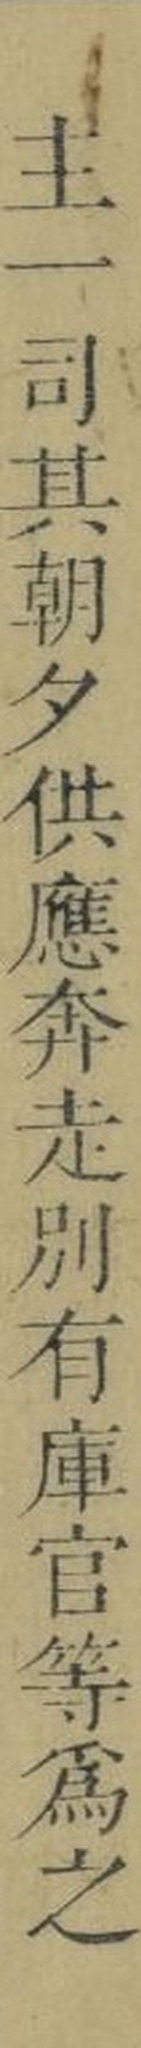主一司其朝夕供應奔走別有庫官等爲之
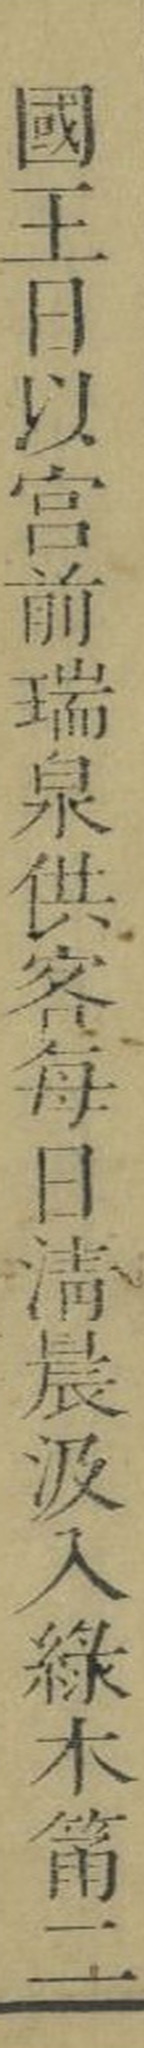國王日以宫前瑞泉供客每日淸晨汲入綠木筩二
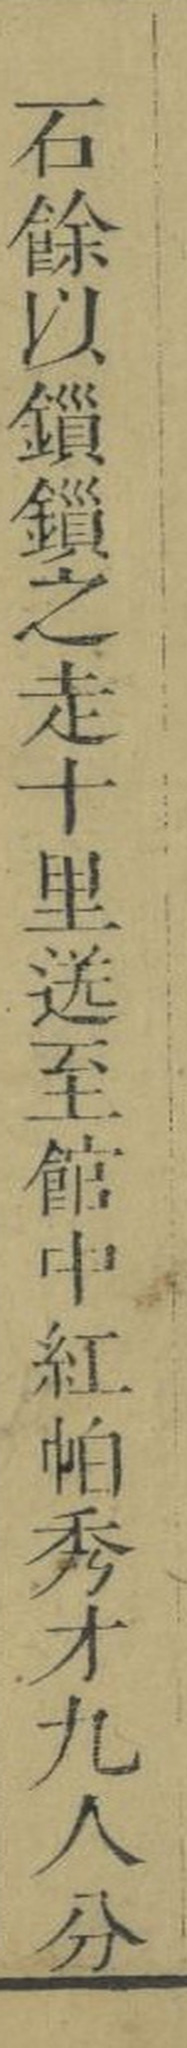石餘以鎻鎻之走十里送至館中紅帕秀才九人分
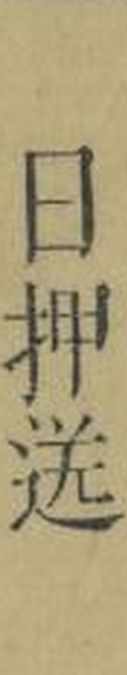日押送
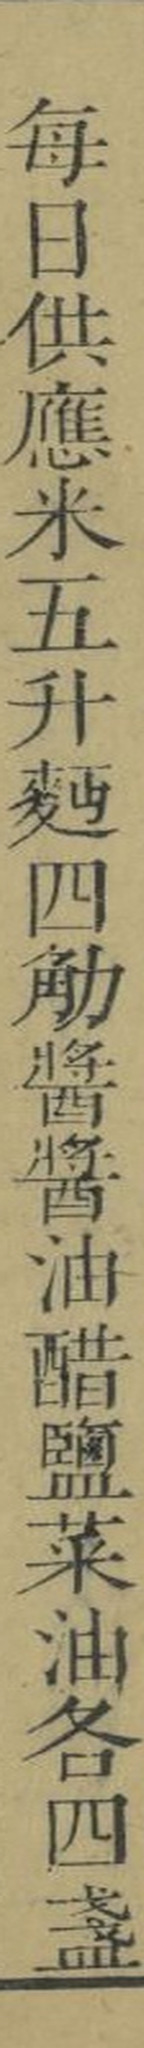每日供應米五升麪四觔醬醬油醋鹽菜油各四盞
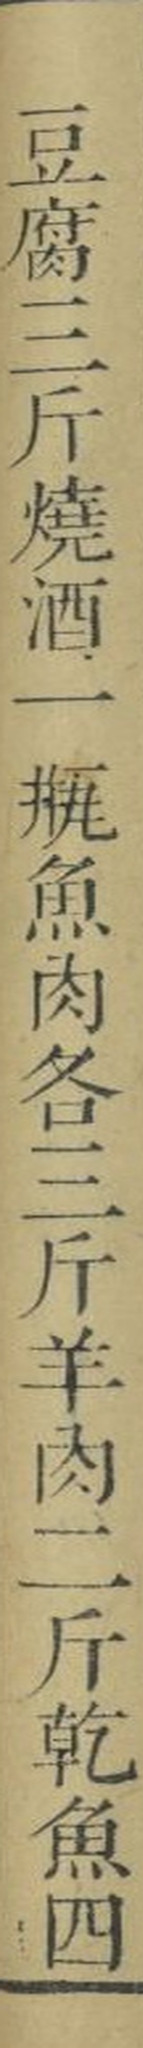豆腐三斤燒酒一甁魚肉各三斤羊肉二斤乾魚四
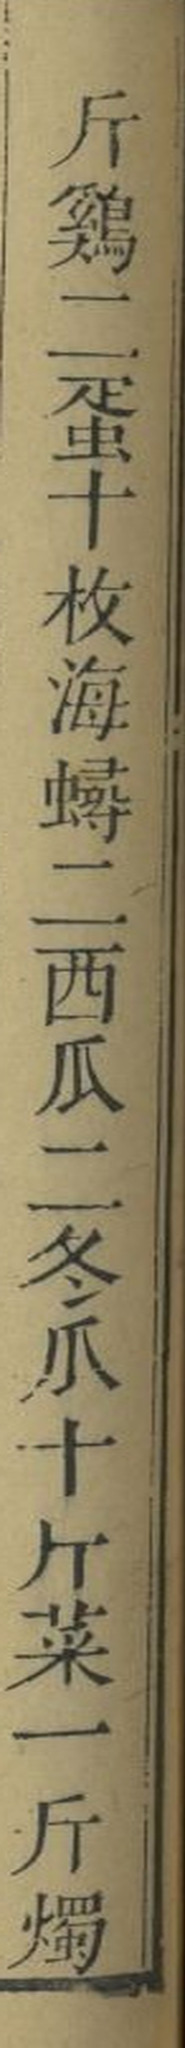斤鷄二蛋十枚海蟳二西瓜二冬瓜十斤菜一斤燭
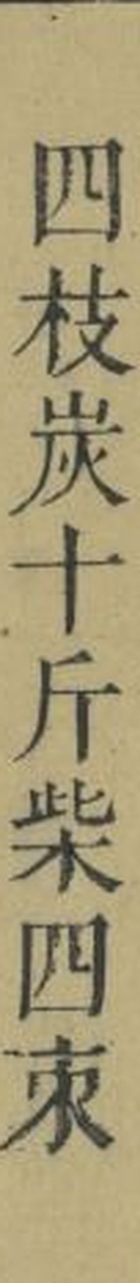四枝炭十斤柴四束
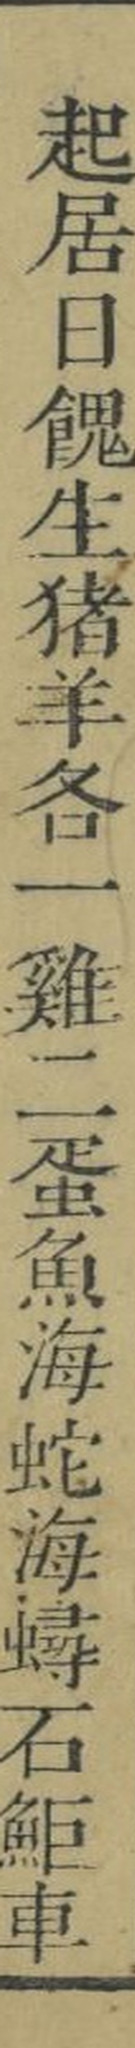起居日餽生猪羊各一雞二蛋魚海蛇海蟳石鮔車
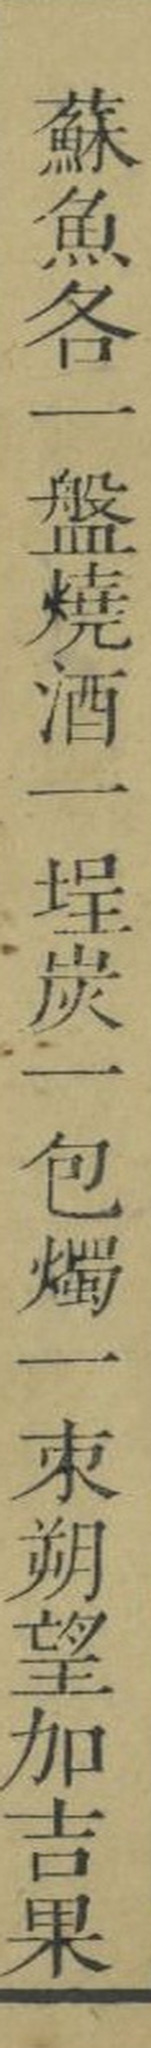蘇魚各一盤燒酒一埕炭一包燭一束朔望加吉果
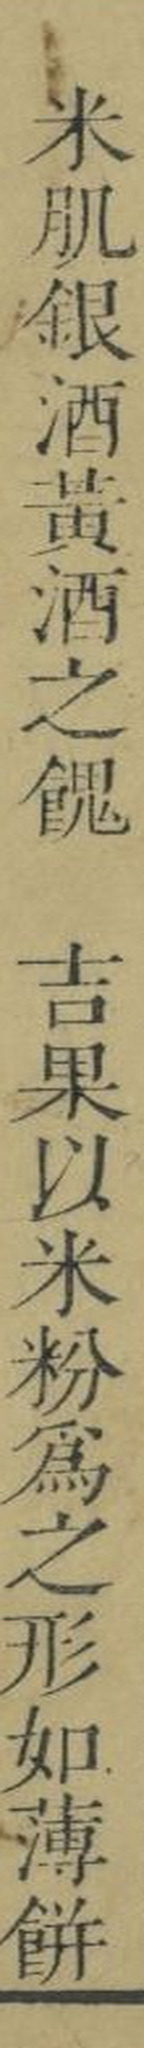米肌銀酒黃酒之餽吉果以米粉爲之形如薄餅
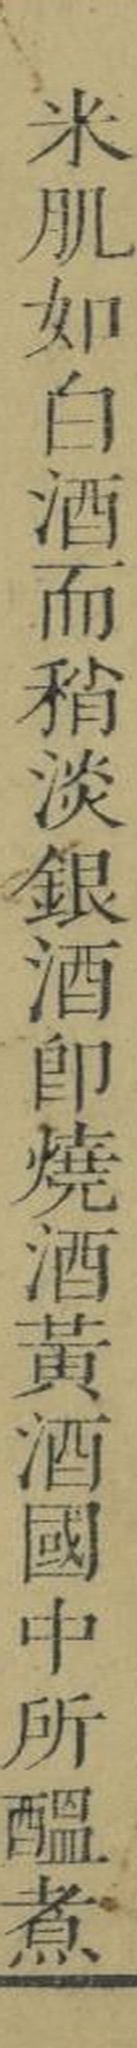米肌如白酒而稍淡銀酒卽燒酒黃酒國中所醞煮
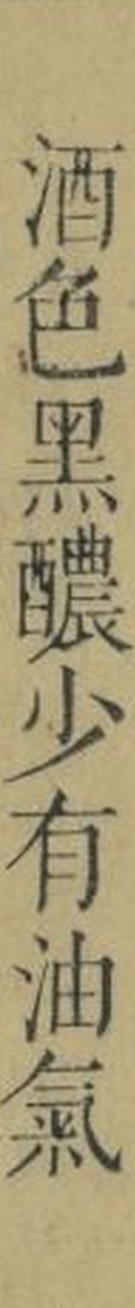酒色黑醲少有油氣
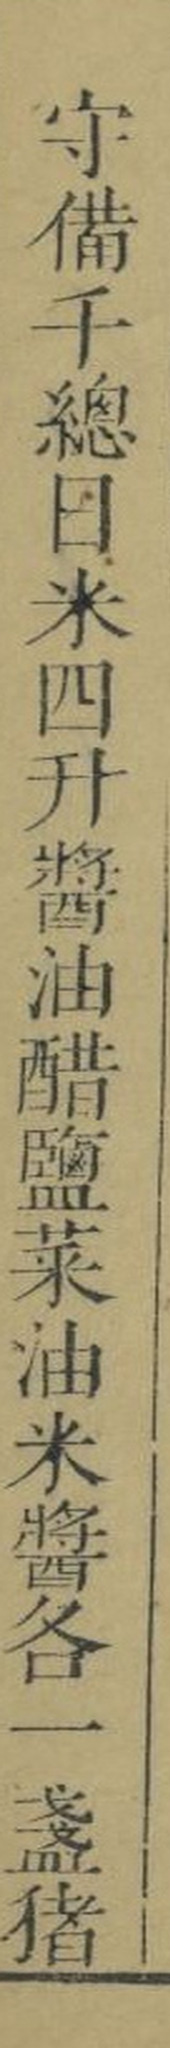守備千總日米四升醬油醋鹽菜油米醬各一盞猪
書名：中山伝信録 巻二
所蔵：University of the Ryukyus Library
